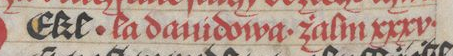Ekl.la dauidowa.żalm xxxv.
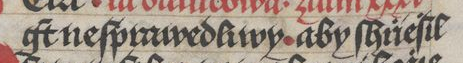ḡt neſprawedliwy.aby ſhṙíeẛil
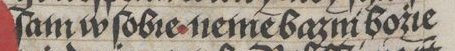ſam w ſobie.neníe bazní bożie
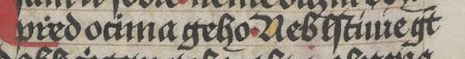pṙed oċima geho.Neb lſtíuie ḡt.
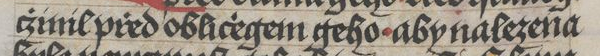cżíníl pṙed obliċegem geho.aby nalezena
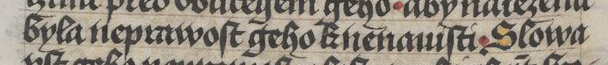byla neprawoſt geho k nenauiſti.Slowa
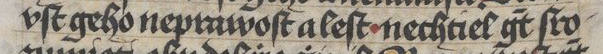vſt geho neprawoſt a leſt.nechtiel ḡt ſro¬
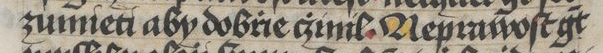zumieti aby dobṙie cżinil.Neprawoſt ḡt
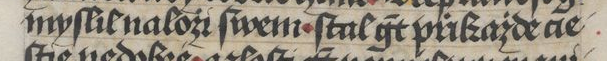myſlil nalożi ſwem.ſtal ḡt pṙikażde cie¬
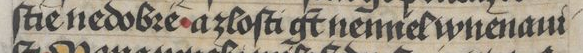ſtie nedobré.a zloſti ḡt nemiel w nenaui¬
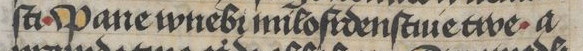ſti.Pane wnebi miloſrdenſtuíe twe.a
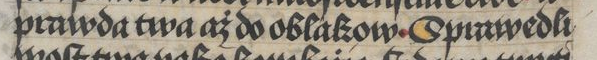prawda twa aż do oblakow.Sprawedli¬
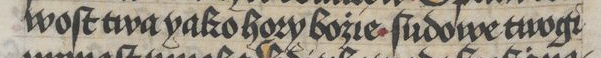woſt twa yako hory bożíe.ſudowe twogi
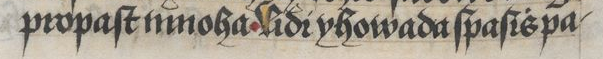propaſt mnoha.Lidi yhowada ſpaſiṡ pa¬
